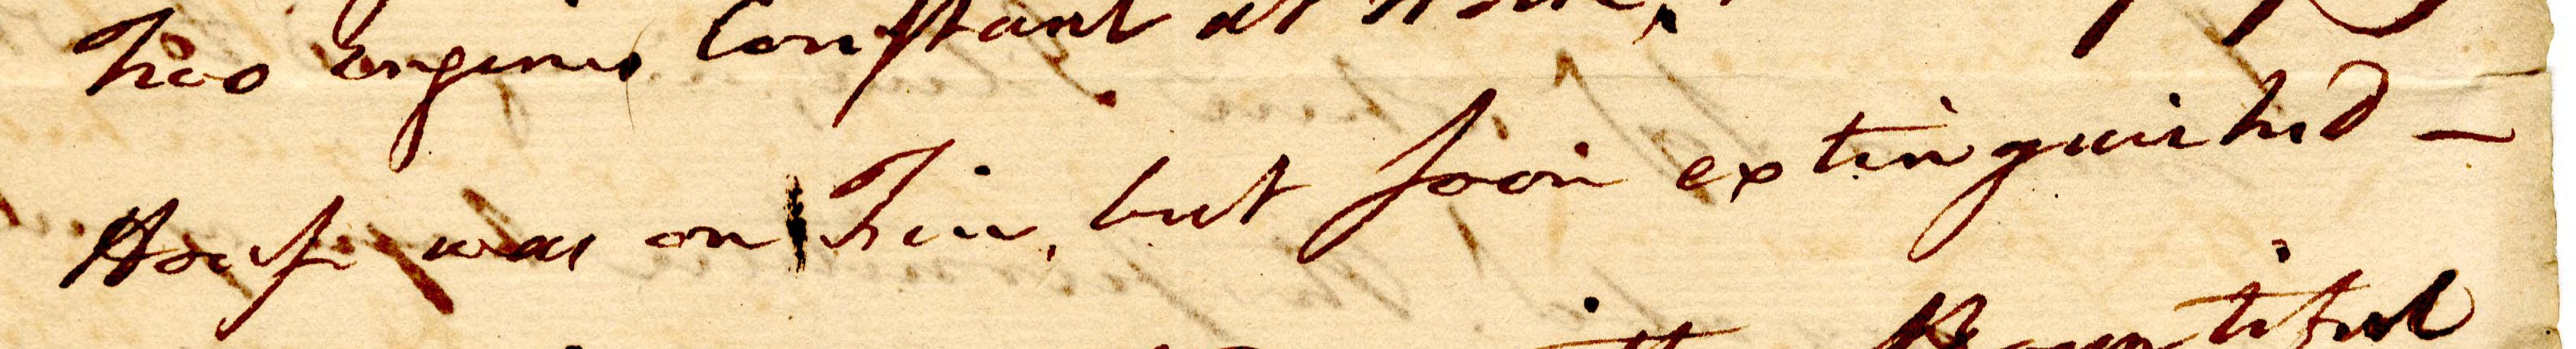House was on Fire, but soon extinguished-
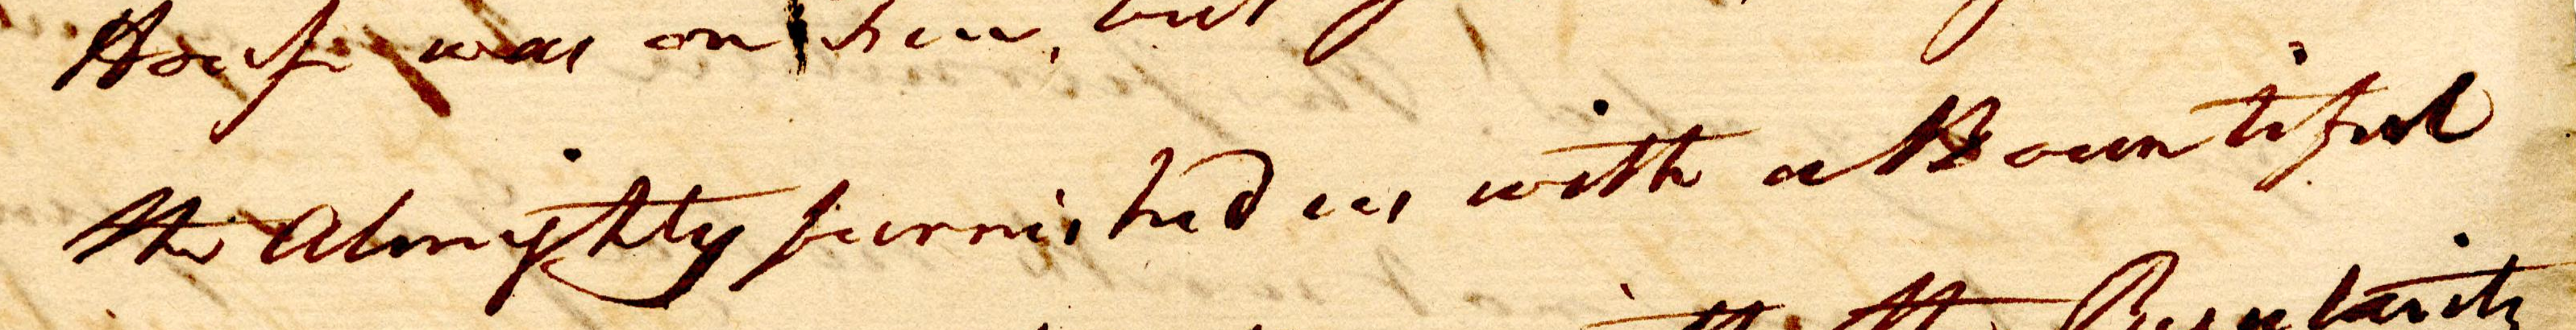the Almighty punished us with a Bountiful
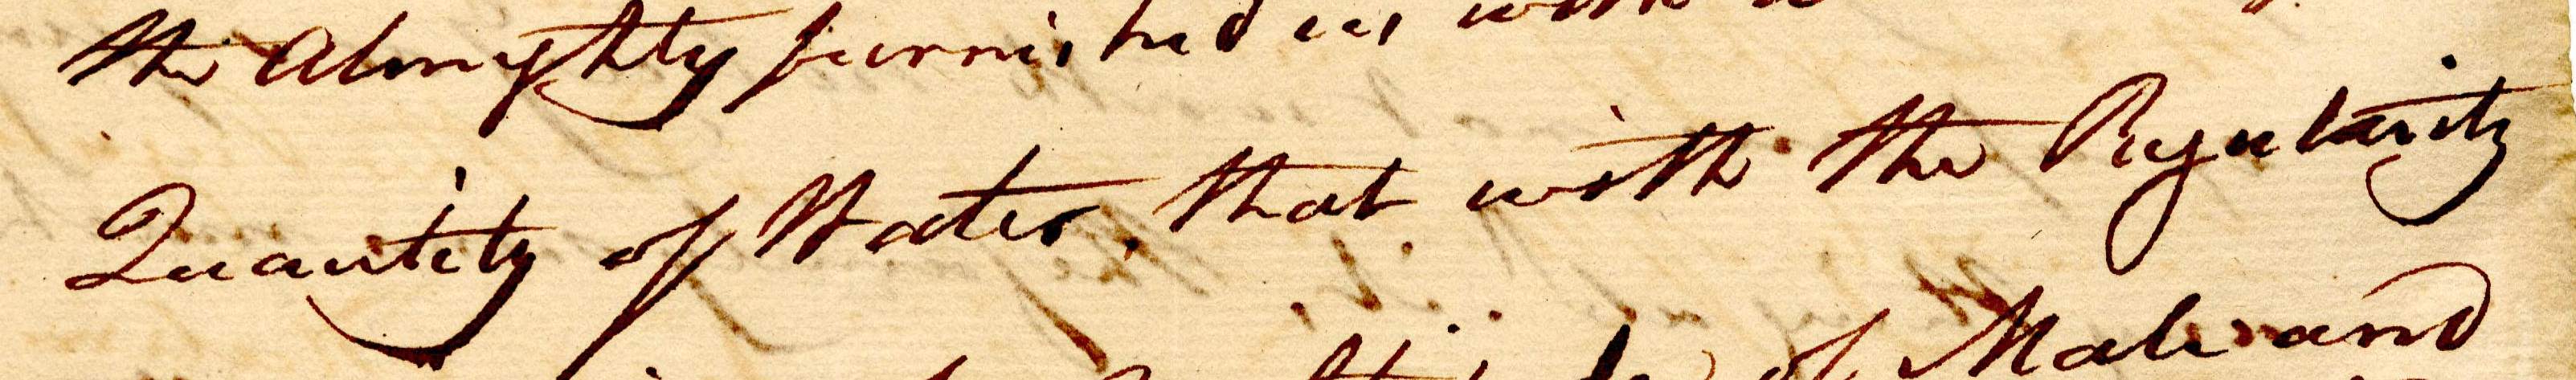Quantity of Water that with the Regularity
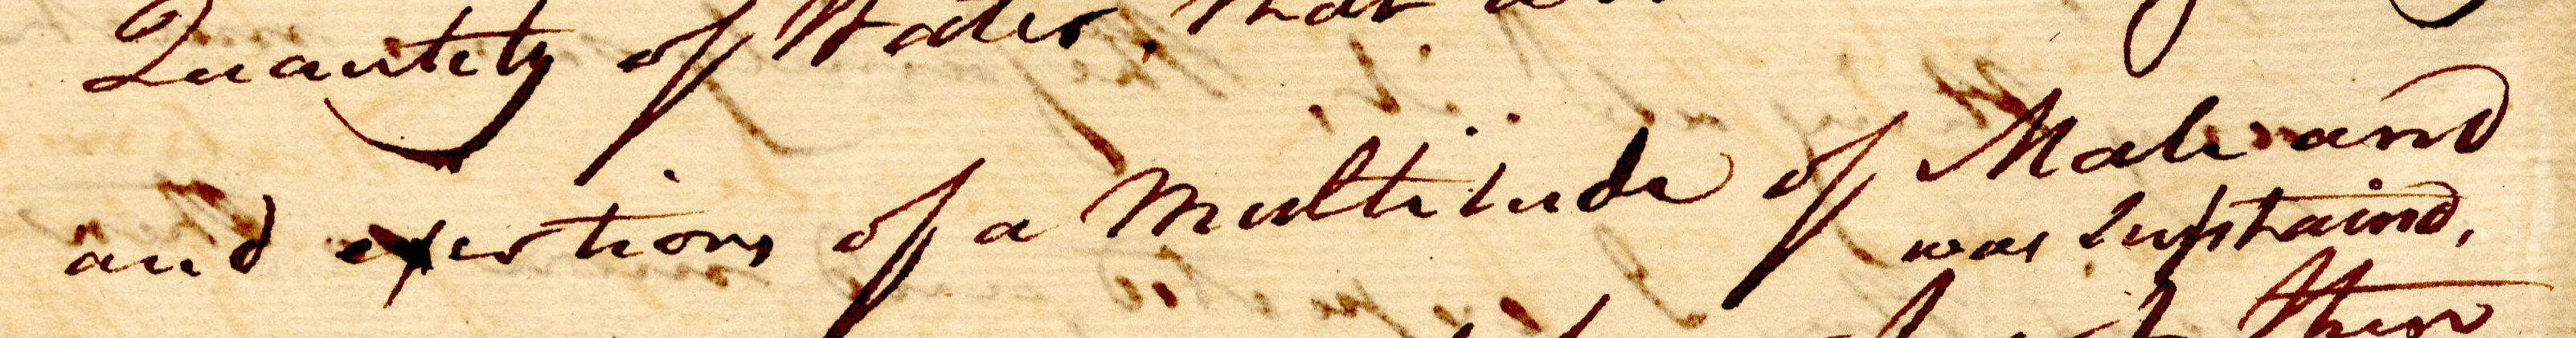and exertion of a multitude of male and
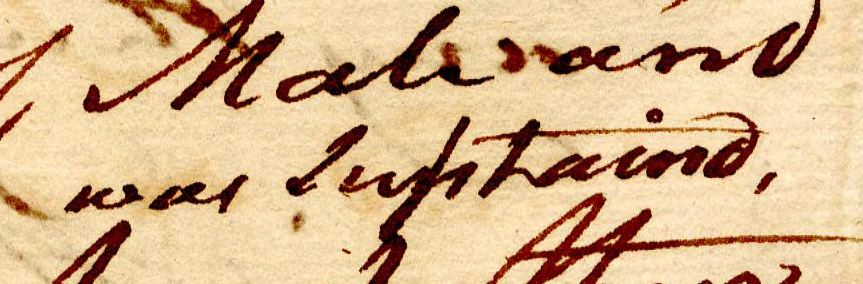was sustaind,
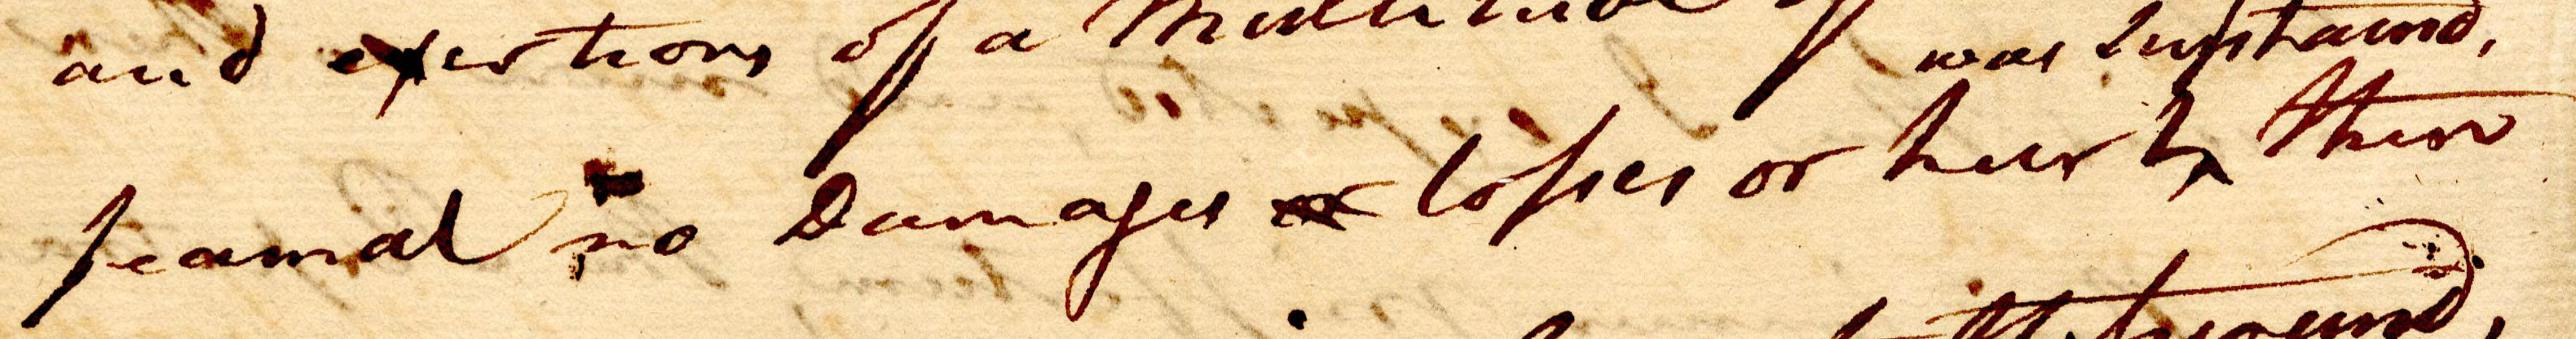female no Damages losses or harm & then
